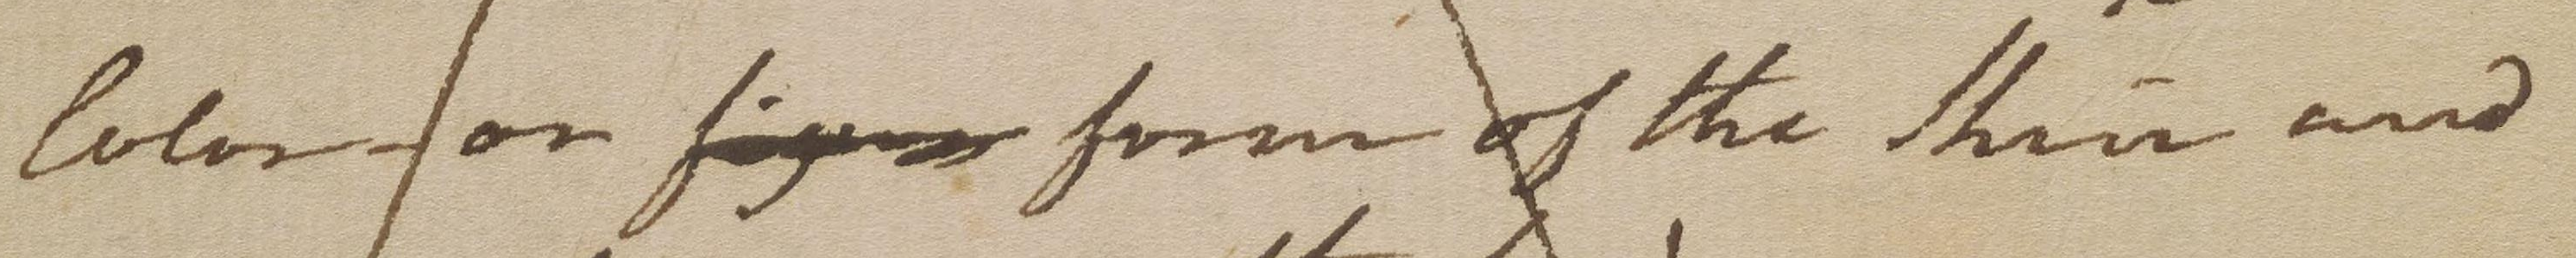color, or [figure] form of the skin and
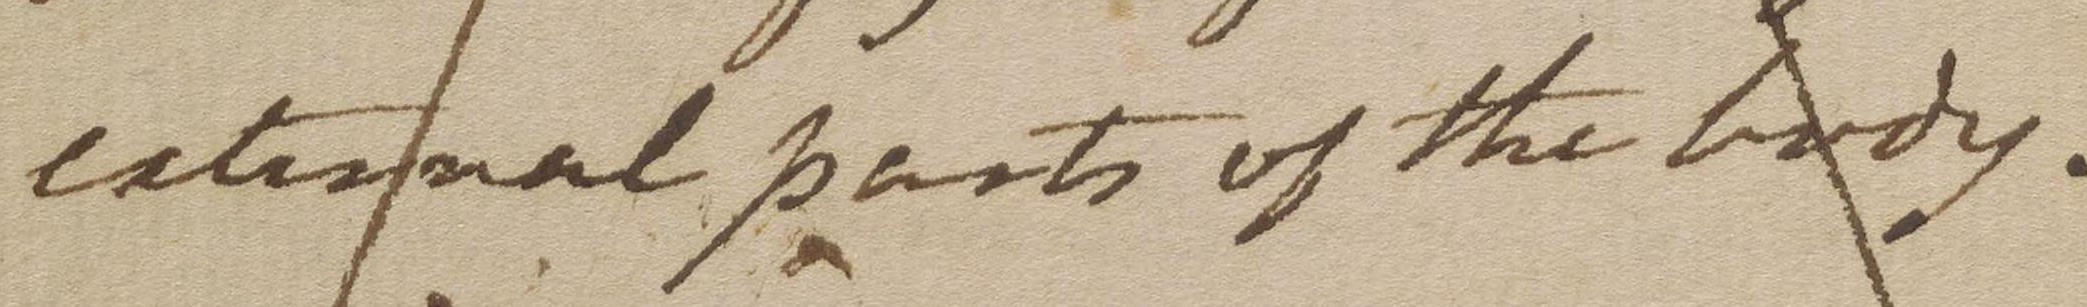external parts of the body.
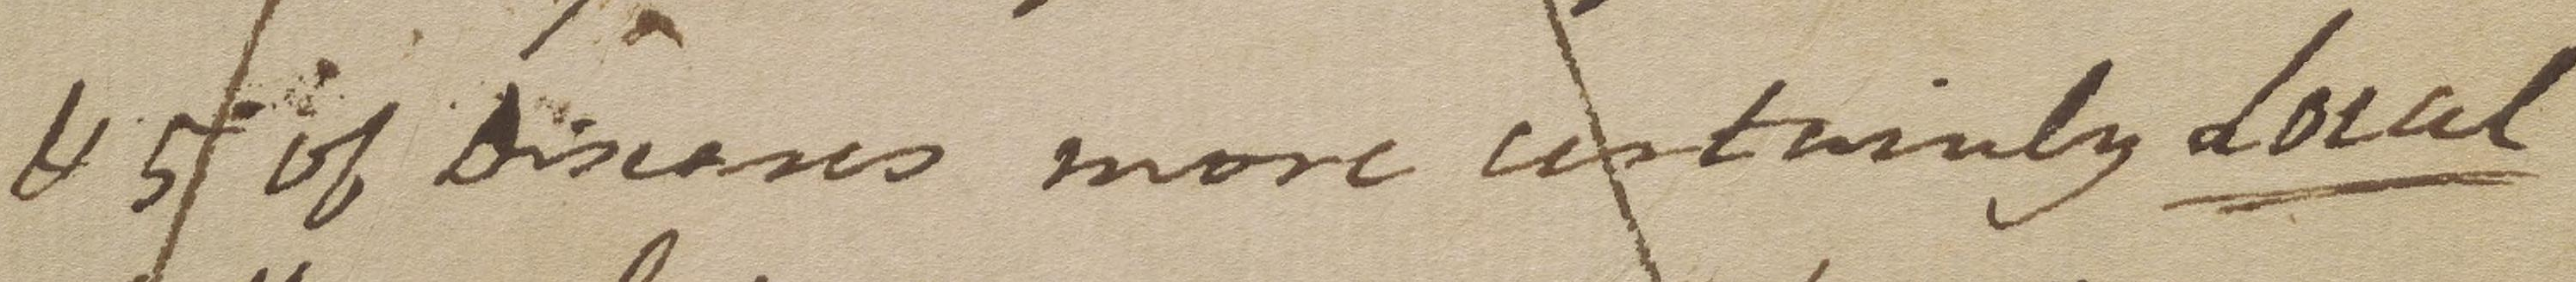& 5 of diseases more certainly Local
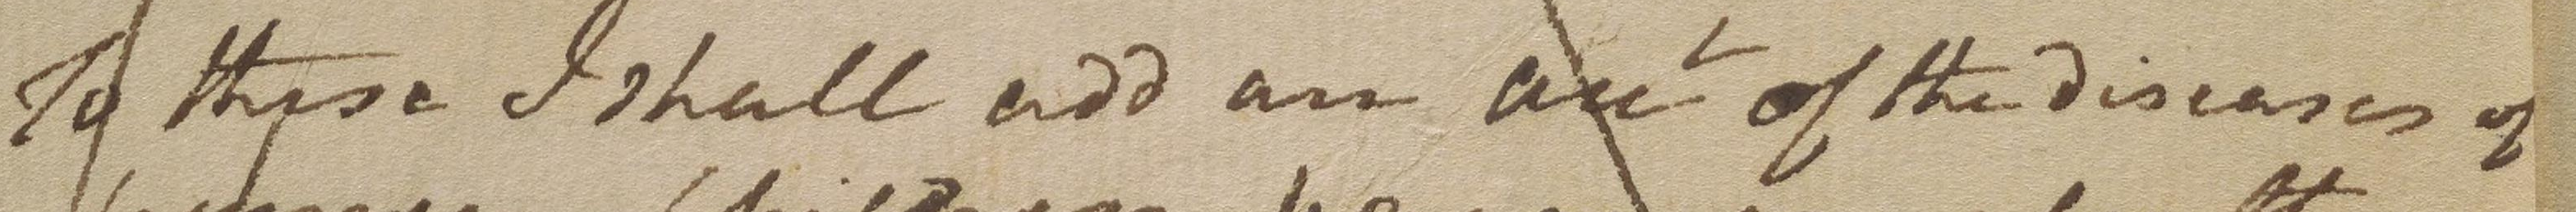To these I shall add are of the diseases of
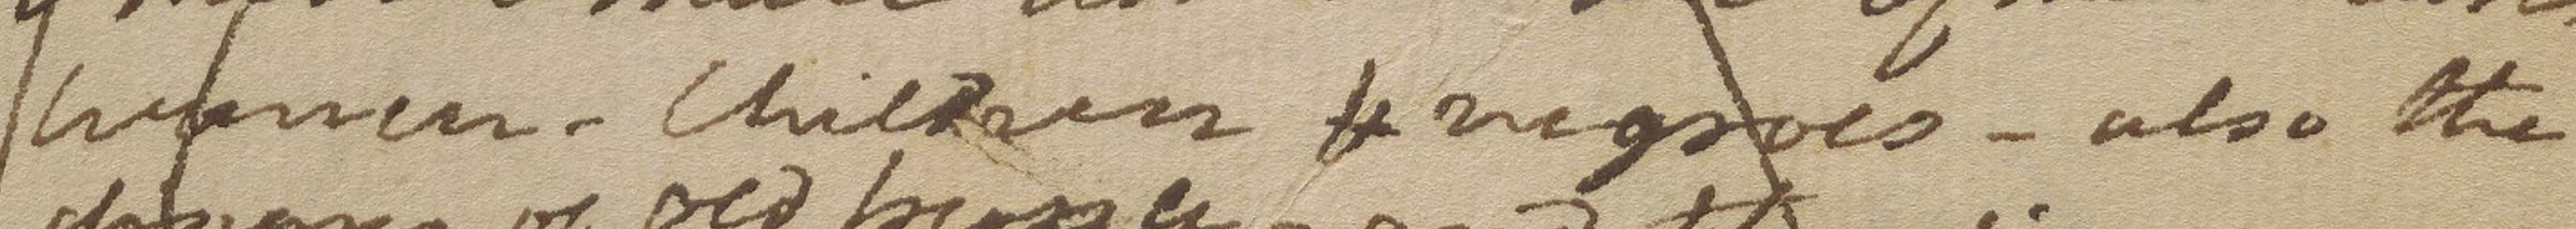women- children, & negroes- also the
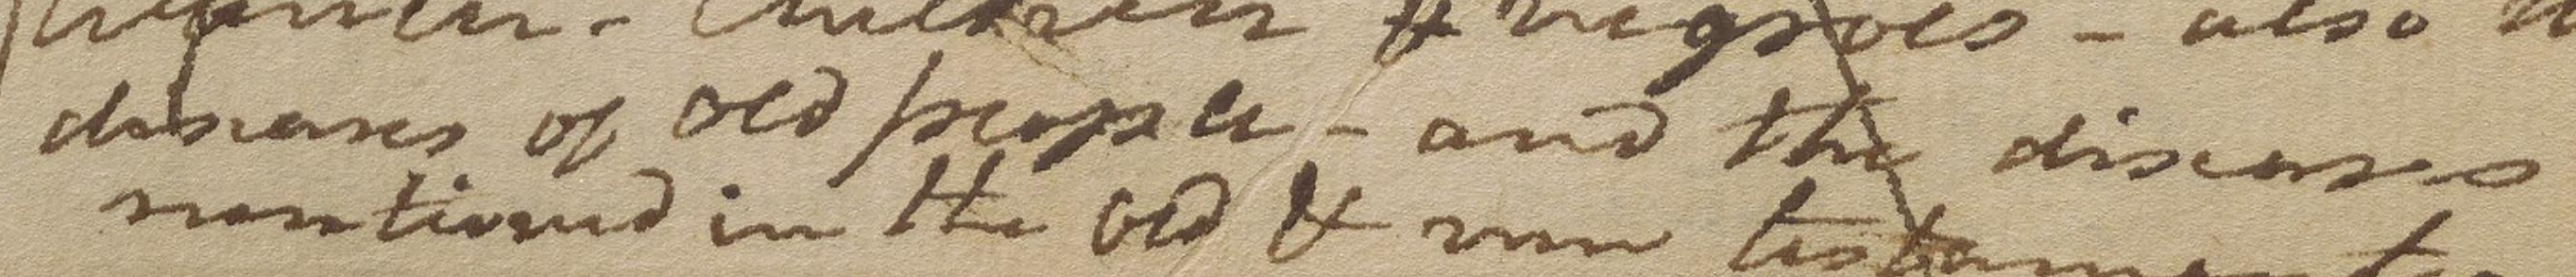diseases of old people- and the diseases
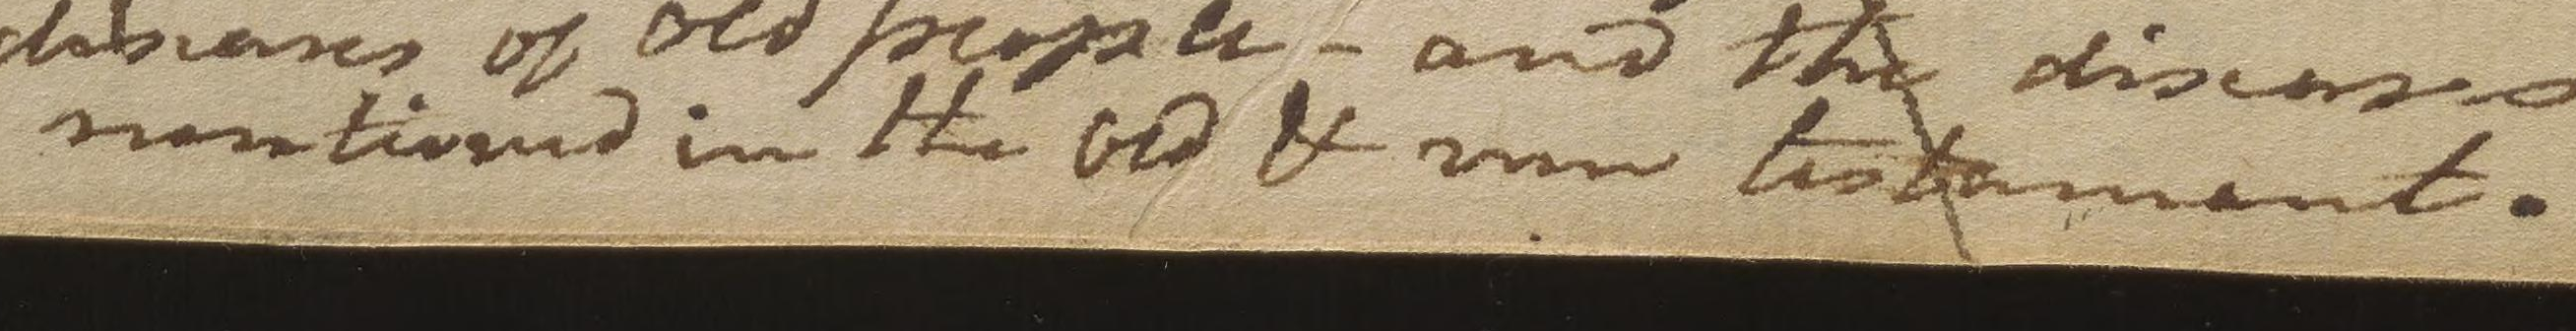mentioned in the old & new testament.
